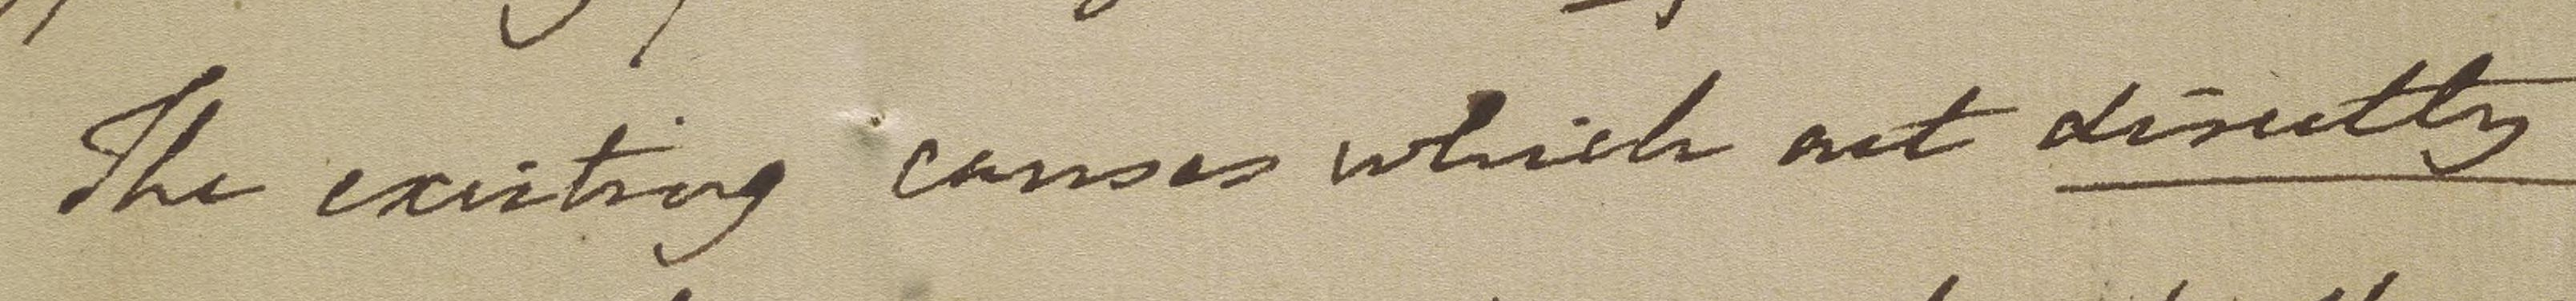The exciting causes which act directly
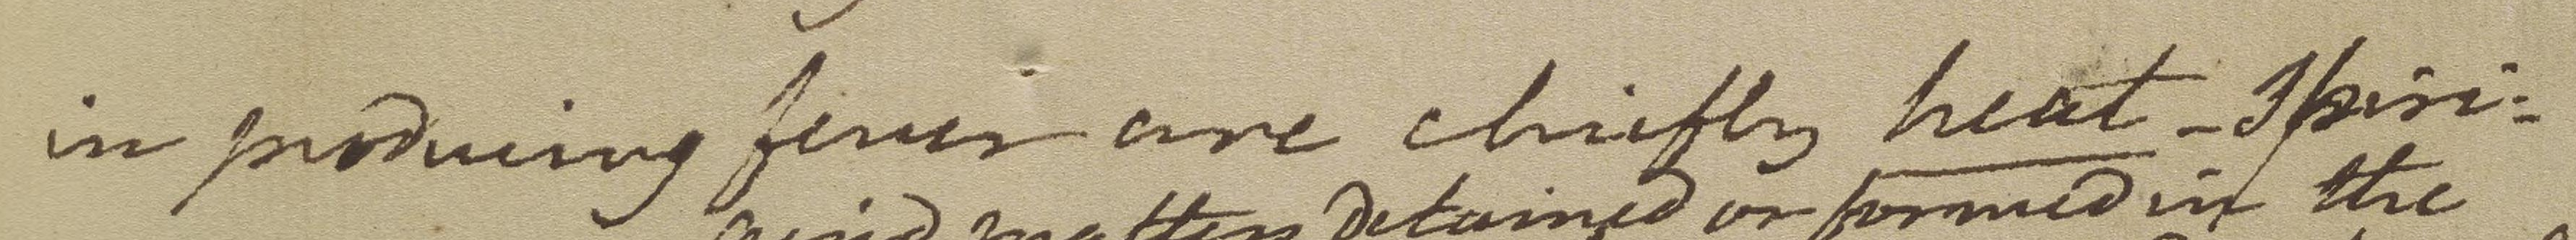in producing fever are chiefly heat. Spiri-
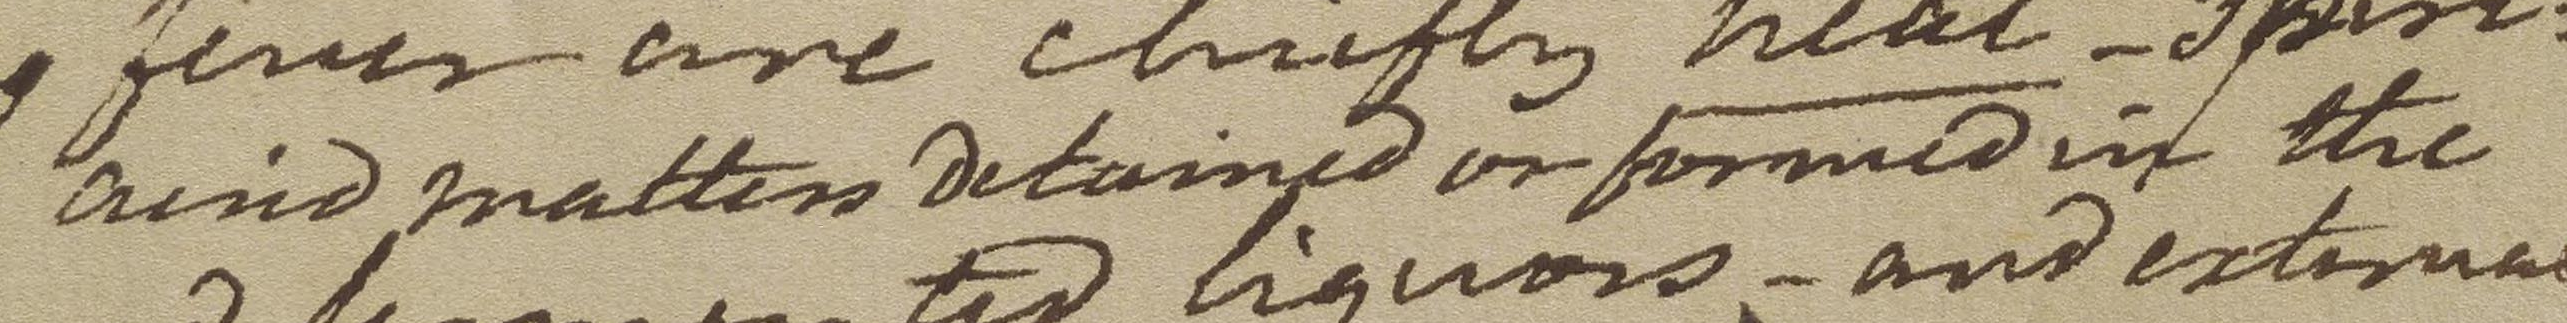and matter detained or formed in the
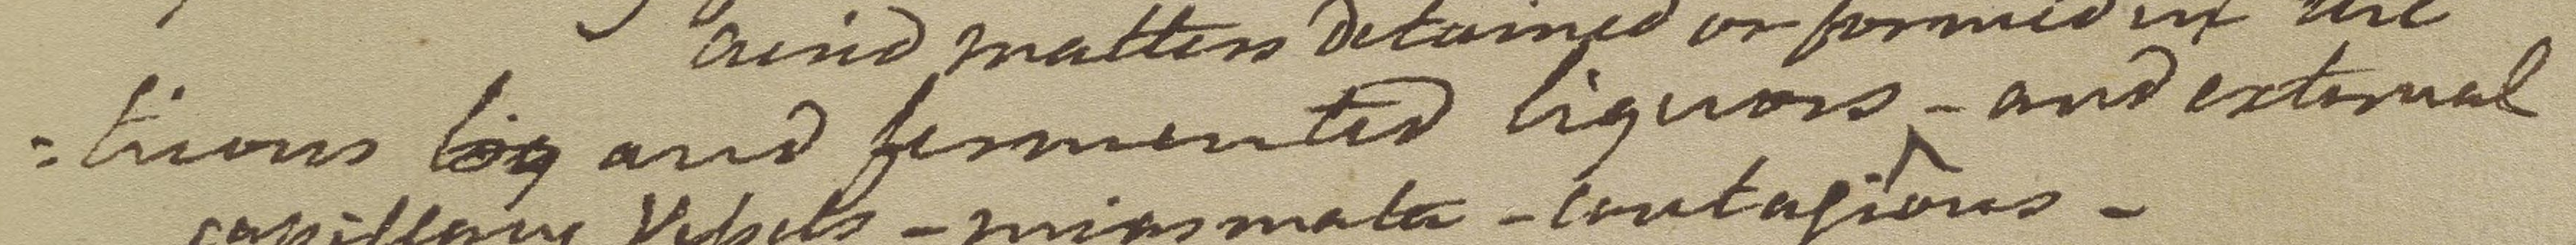-tous [liq] and fermented liquors ^ and external
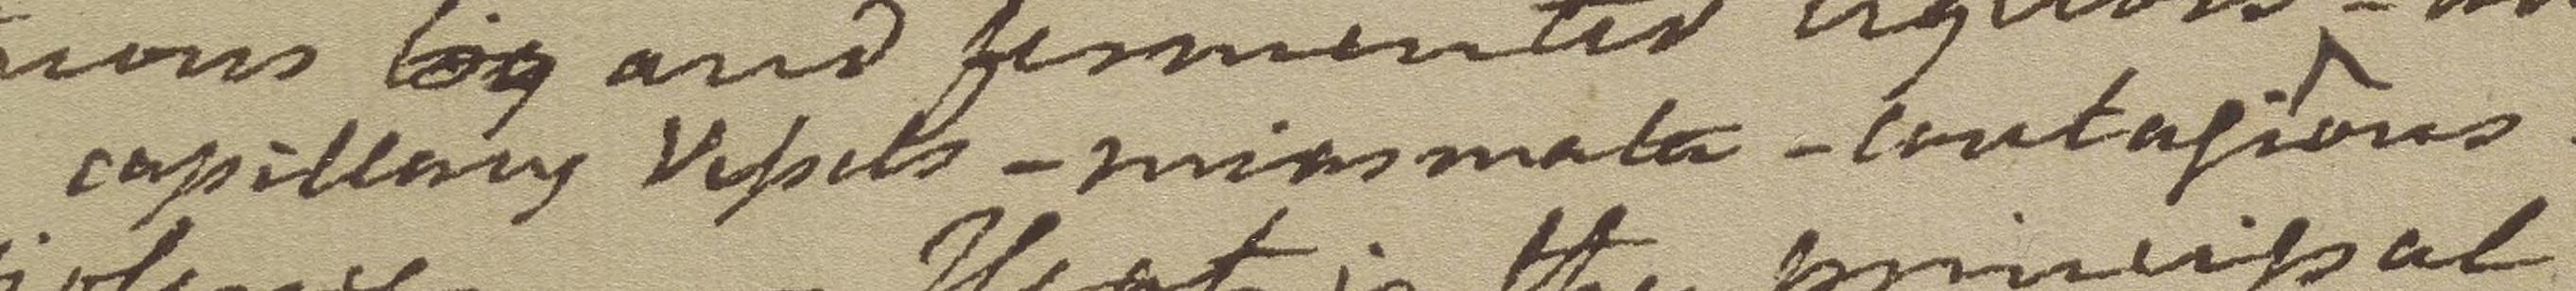capillary vessels - miasmata - contagions
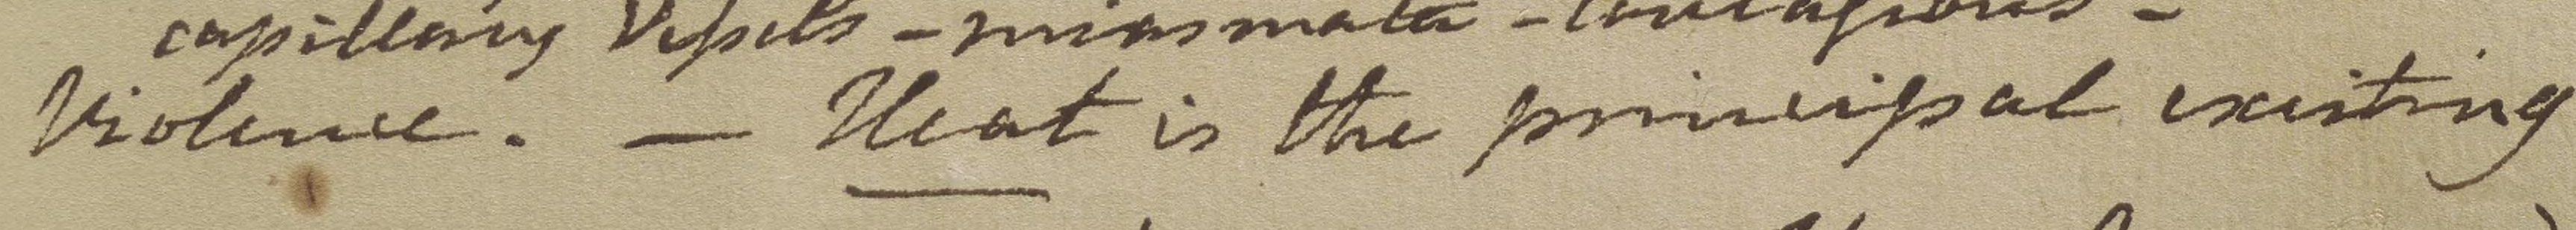violence.- Heat is the principal exciting
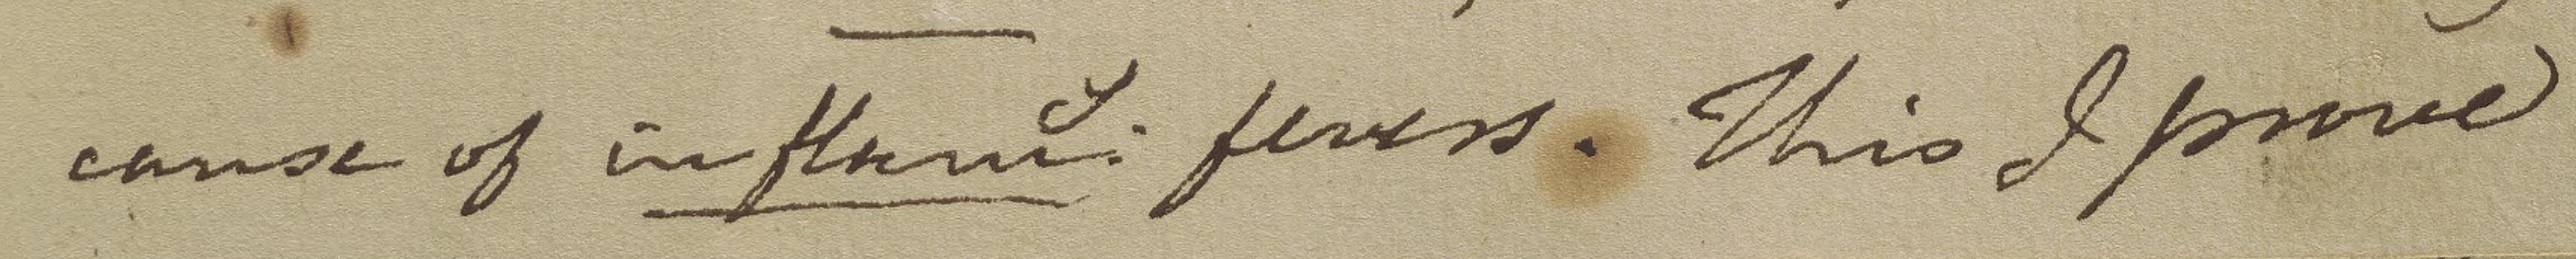cause of inflam^y fevers. This I prove
